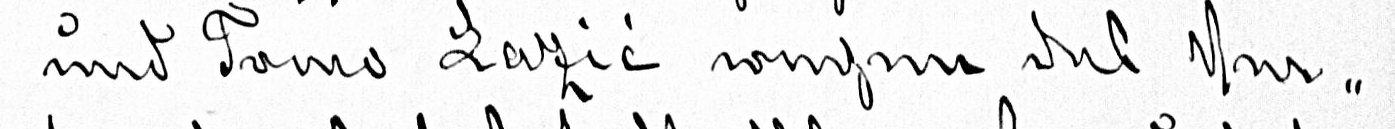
und Tomo Lazić wegen das Ver¬
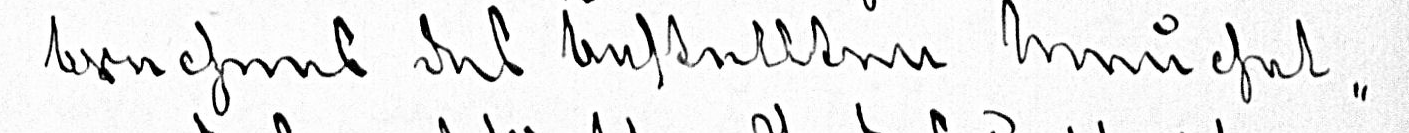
Verbrechens des bestellten Meuchel¬
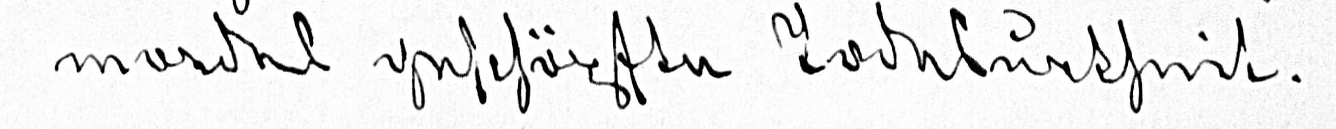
mordes geschöpfte Todesurtheit.
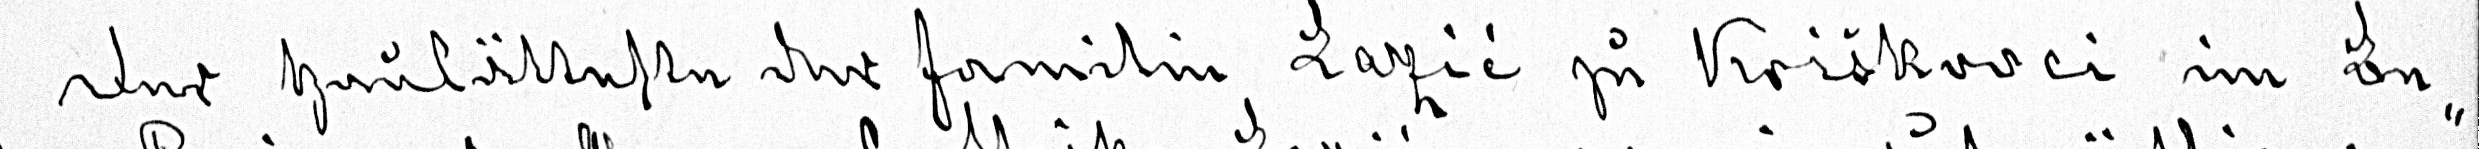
Der Hausätteste der Familie Lazić zu Kriskovci im Be¬
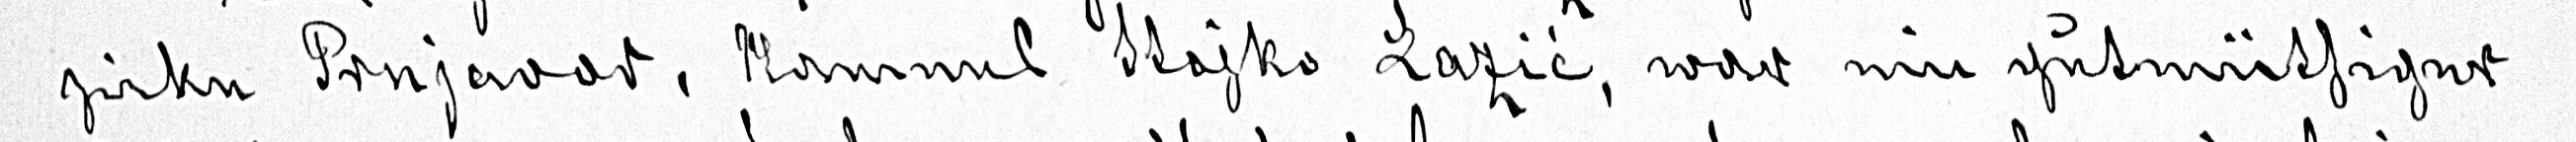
zirke Prejavod, Namens Kojko Lazić, war ein gutmüthiger
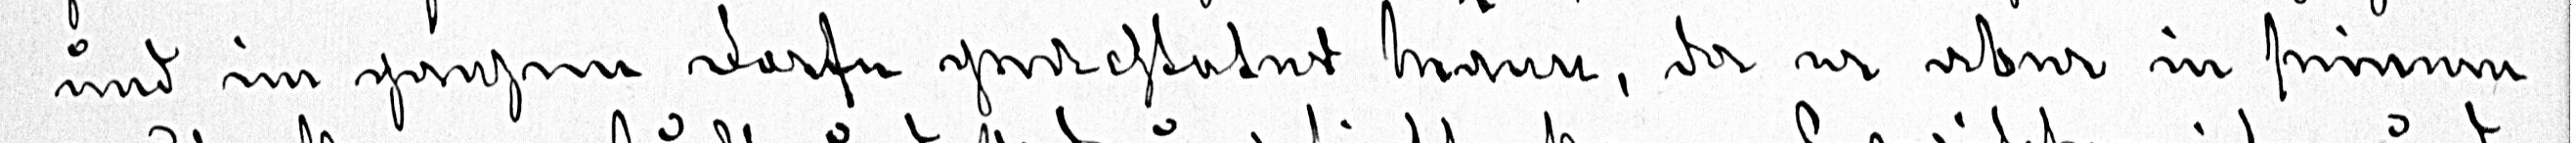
und im gegen Dorfe gnachtetet Mann, der er aber in seinen
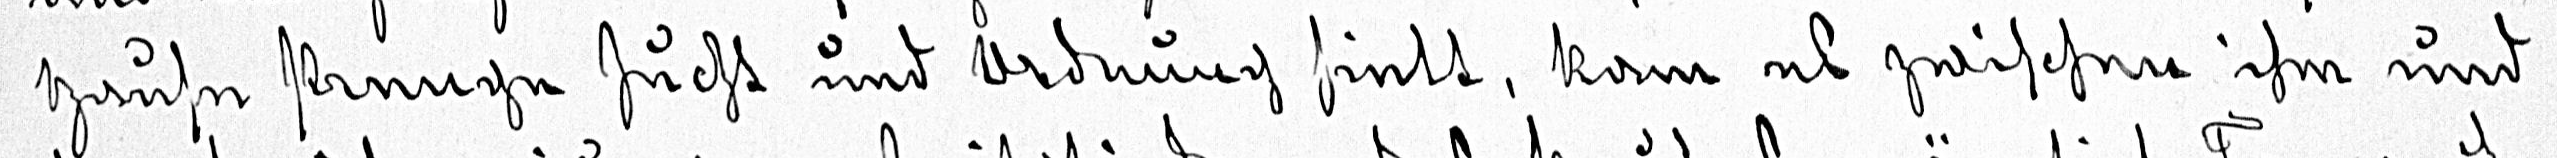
Hause Strenge Zucht und Ordnung hielt, kam es zwischen ihm und
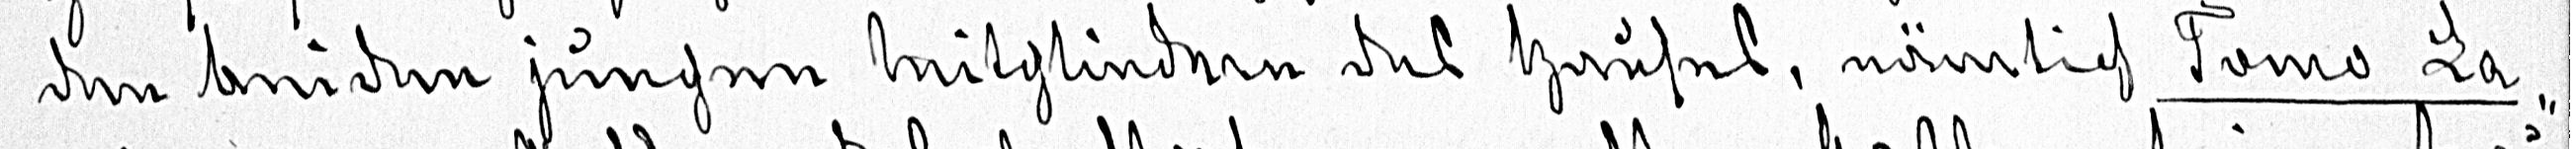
den beiden jungen Mitgliedern des Hauses, nämlich Tomo La¬
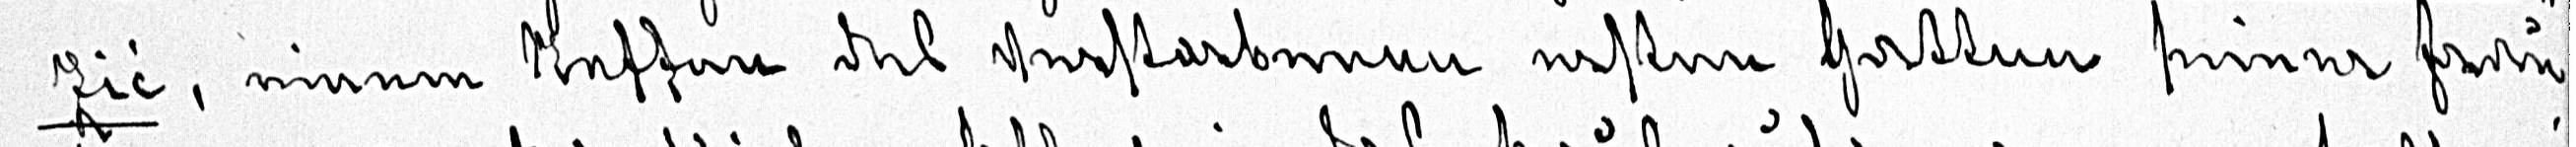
zić, einem Neffen des verstorbenen ersten Gatten seiner Frau
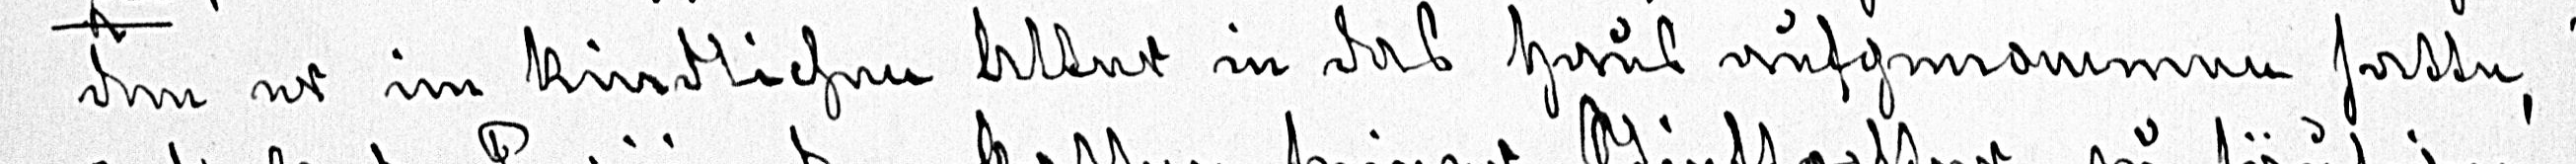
den er im Kindlichen Alter in das Haus aufgenommen hatte,
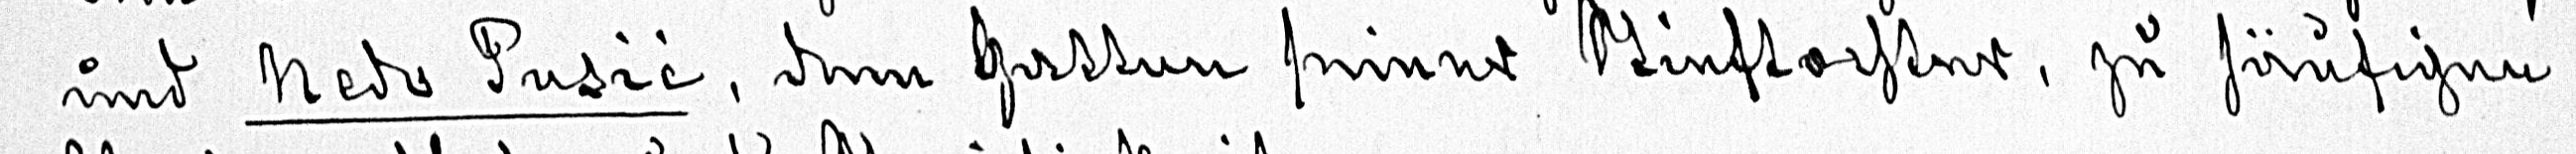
und Nedo Pusić, dem Gatten seines Stieftochter, zu häufigen
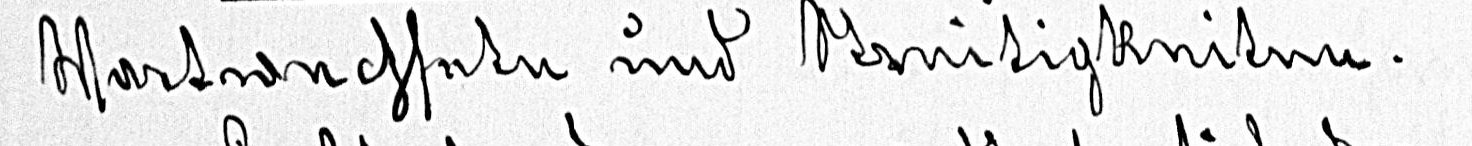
Wartwechsete und Streitigkeiten.
